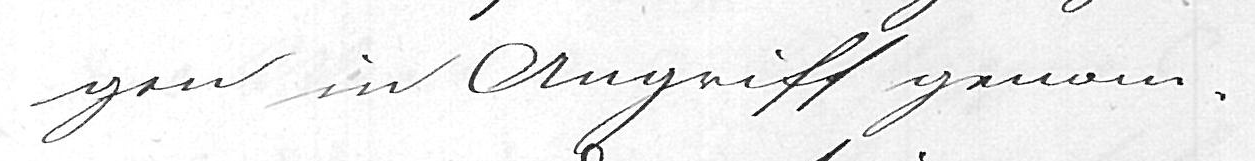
gen in Angriff genom-
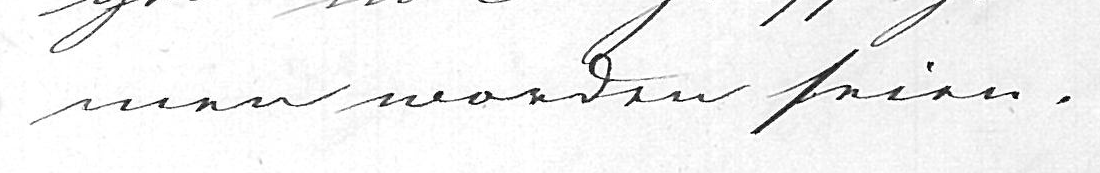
men worden seien.
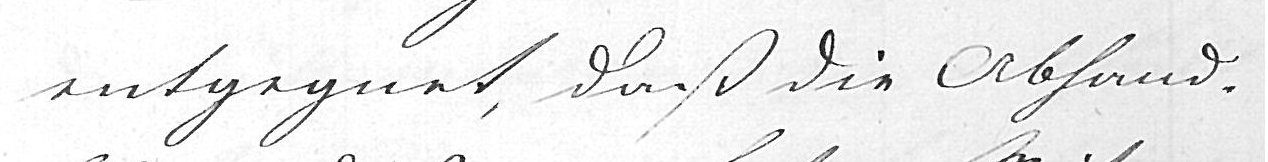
entgegnet, daß die Abhand-
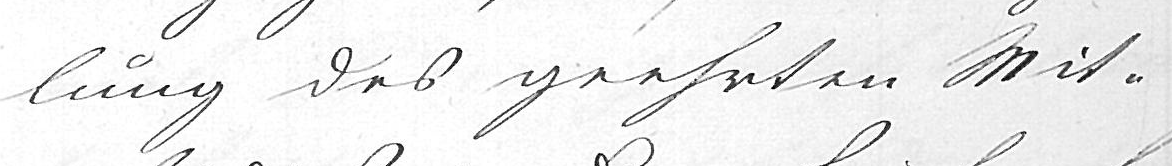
lung des gelehrten Mit-
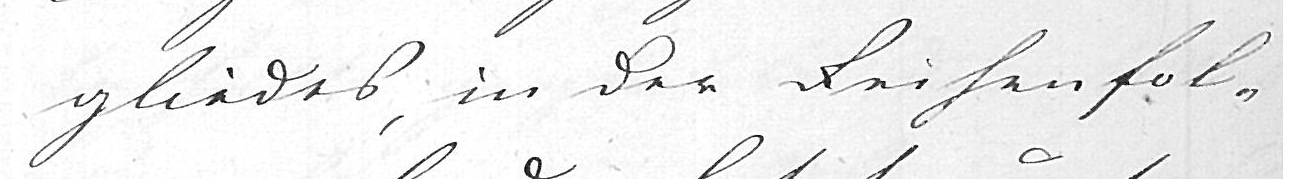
gliedes in der Reihenfol-
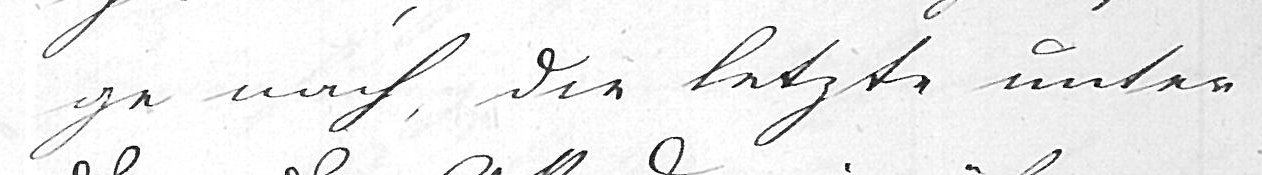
ge nach, der letzte unter
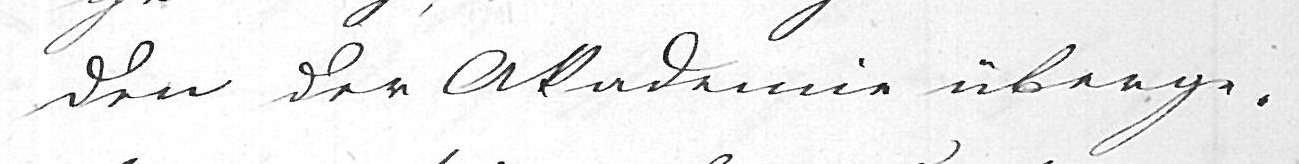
den der Akademie überge-
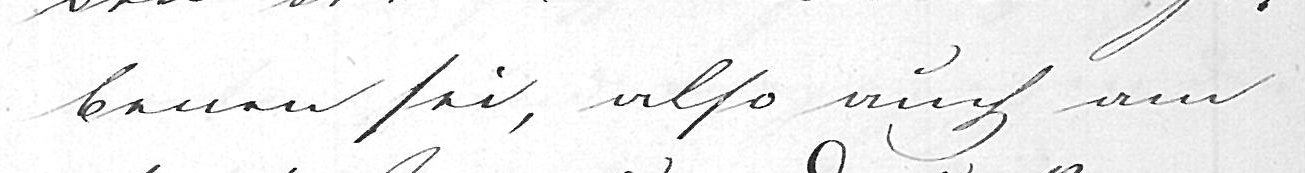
benen sei, also auch am
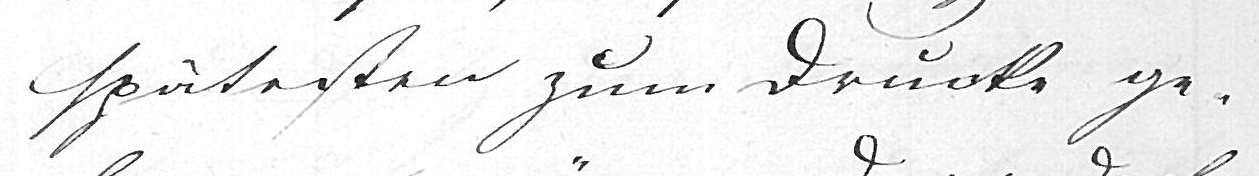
spätesten zum Druck ge-
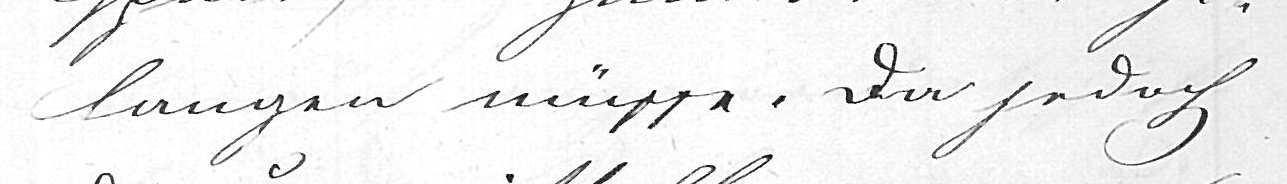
langen müsse. Da jedoch
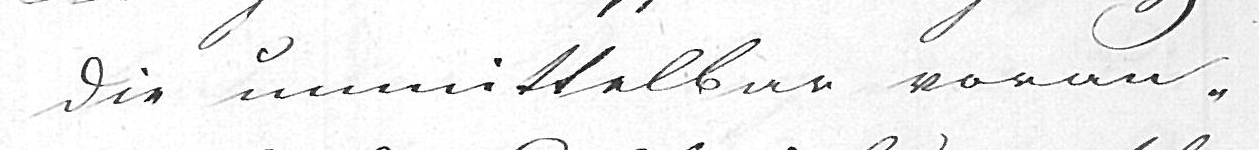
die unmittelbar voran-
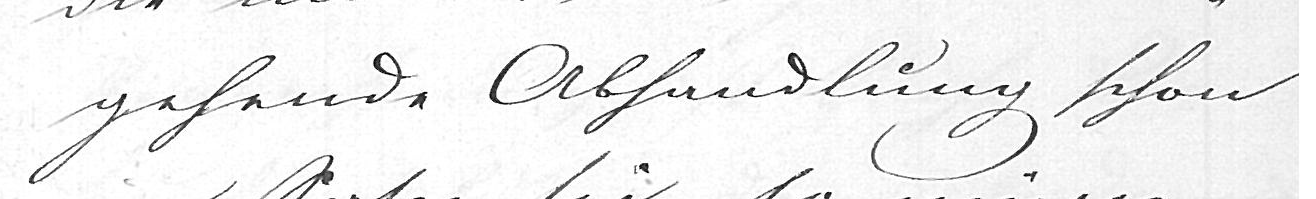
gehende Abhandlung schon
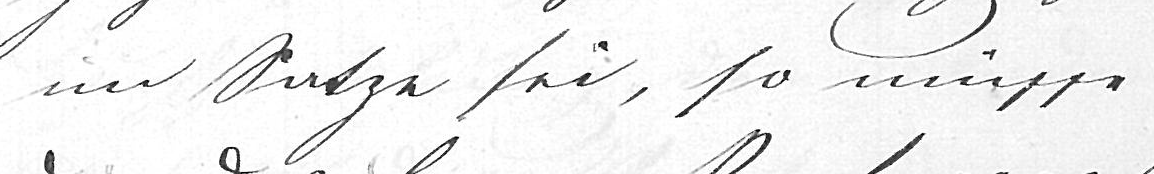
im Satze sei, so müsse
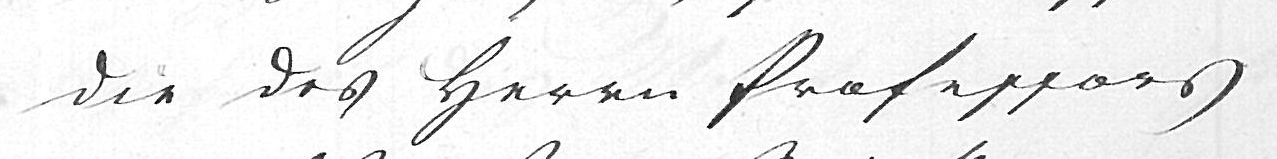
die des Herrn Professors
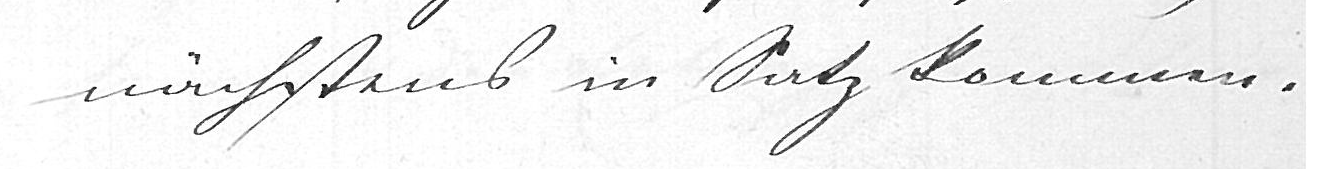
nächstens in Satz kommen.
